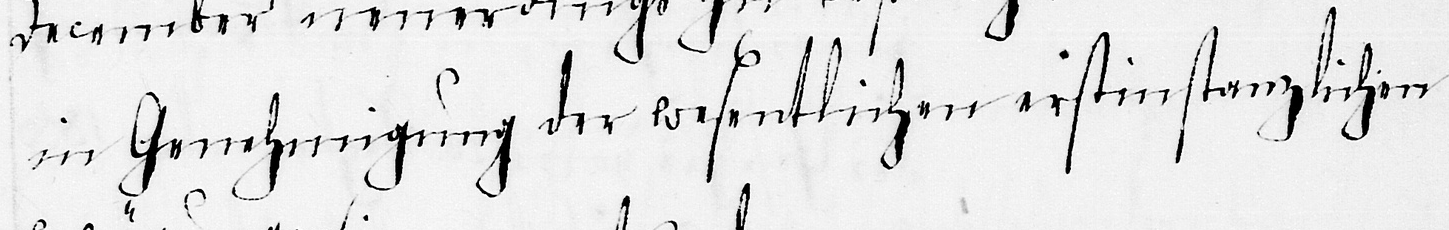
in Genehmigung der wesentlichen erstinstanzlichen
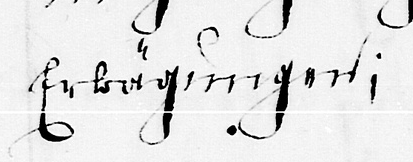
Erwägungen;
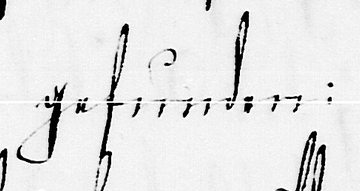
gefunden:
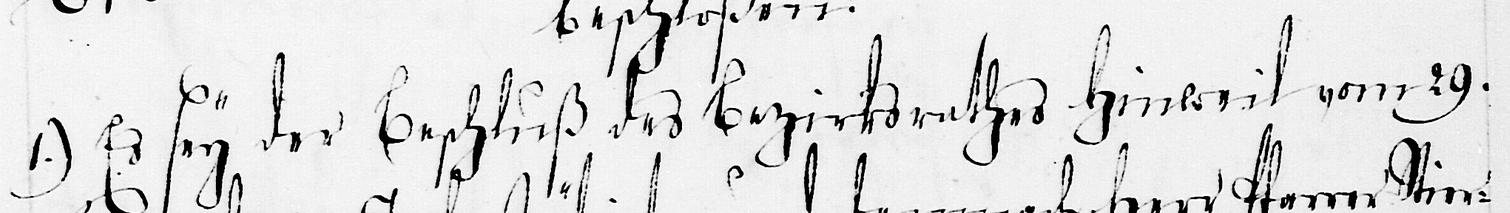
1.) Es sey der Beschluß des Bezirksrathes Hinweil vom 29.
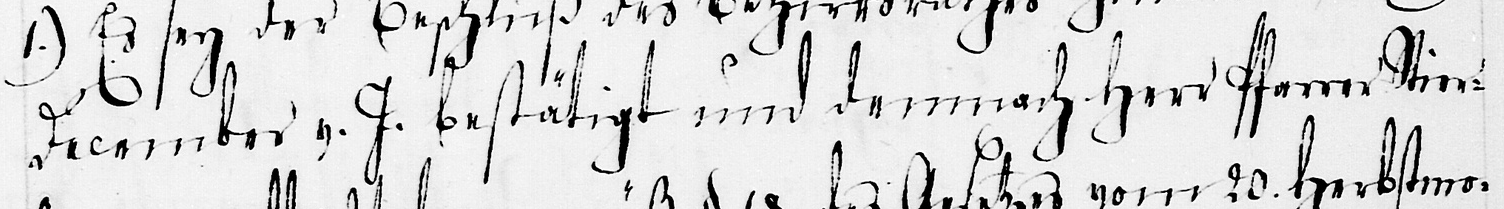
December v. J. bestätigt und demnach Herr Pfarrer Stie¬
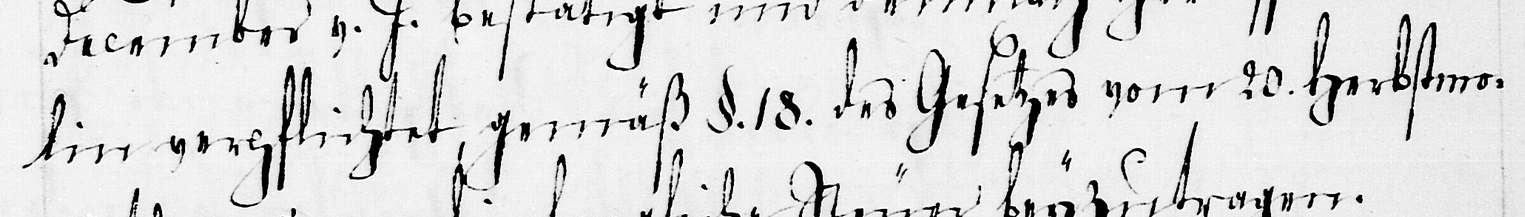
rlin verpflichtet, gemäß §. 18. des Gesetzes vom 20. Herbstmo¬
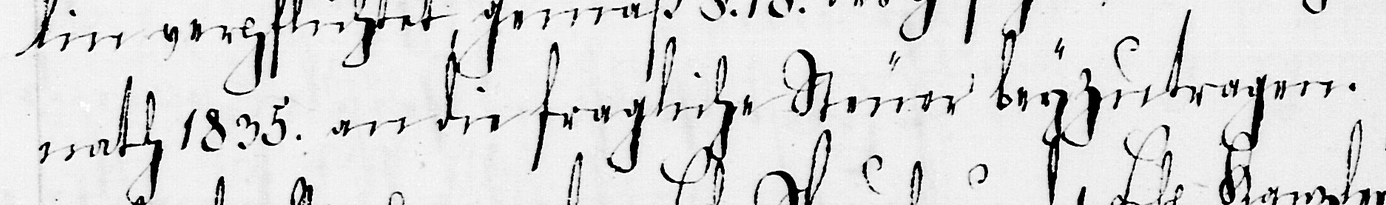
nath 1835. an die fragliche Steuer beyzutragen.
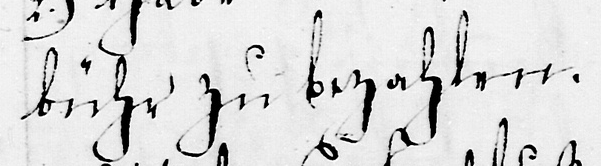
bühr zu bezahlen.
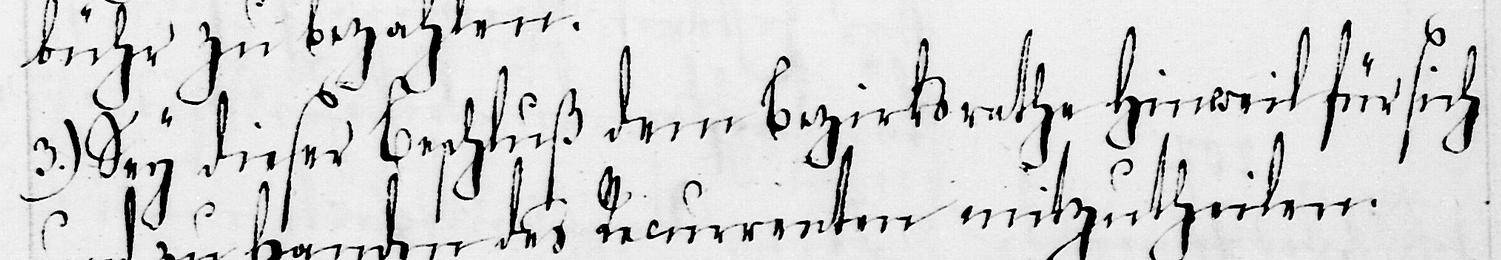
3.) Sey dieser Beschluß dem Bezirksrathe Hinweil für sich
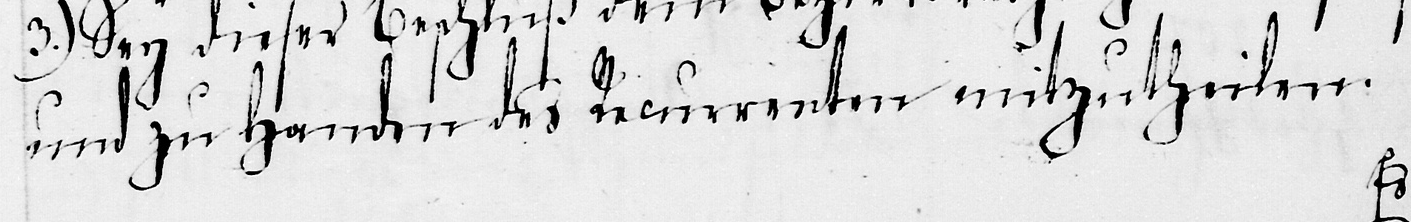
und zu Handen des Recurrenten mitzutheilen.
